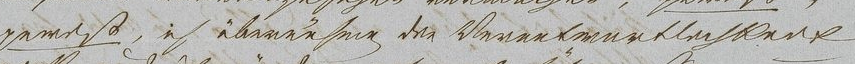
gewiß, ich übernähme die Verantwortlichkeit
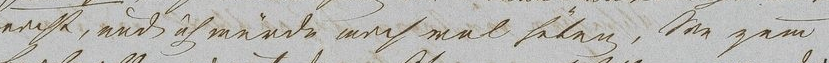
nicht, und ich würde mich wol hüten, Sie zum
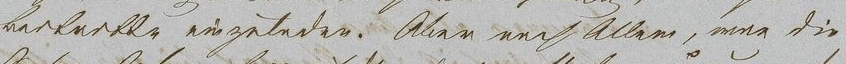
Beitritte einzuladen. Aber nach Allem, wie die
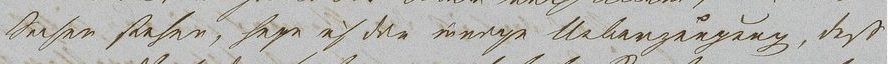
Sachen stehen, hege ich die innige Ueberzeugung, daß
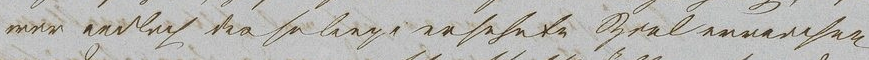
wir endlich das so lange ersehnte Ziel erreichen
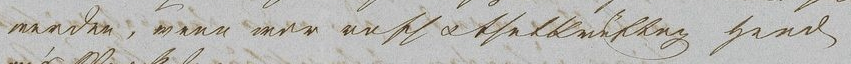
werden, wenn wir rasch & thatkräftig Hand
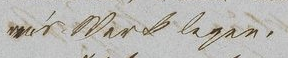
an's Werk legen.
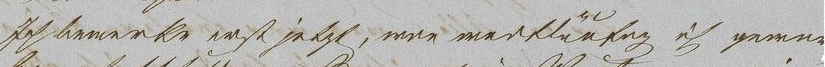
Ich bemerke erst jetzt, wie weitläufig ich gewor-
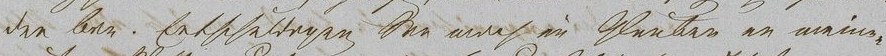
den bin. Entschuldigen sie mich im Glauben an meinen
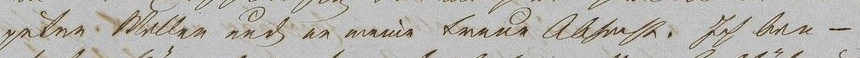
guten Willen und an meine treue Absicht. Ich bin –
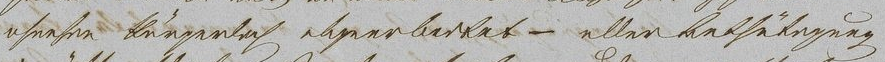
ohnehin körperlich abgearbeitet – aller Bethätigung
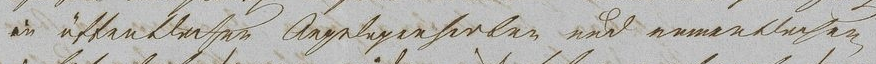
in öffentlichen Angelegenheiten und namentlichen
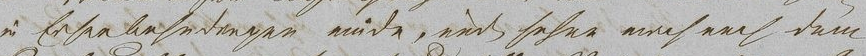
in Eisenbahndingen müde, und sehne mich nach dem
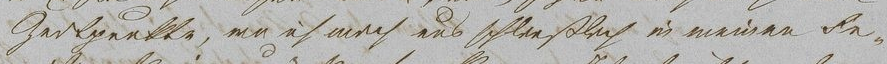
Zeitpunkte, wo ich mich ausschließlich in meinen Fa-
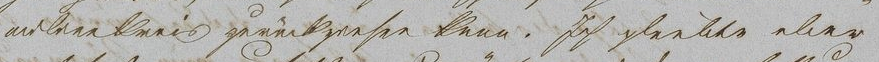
milienkreis zurückziehen kann. Ich glaubte aber
